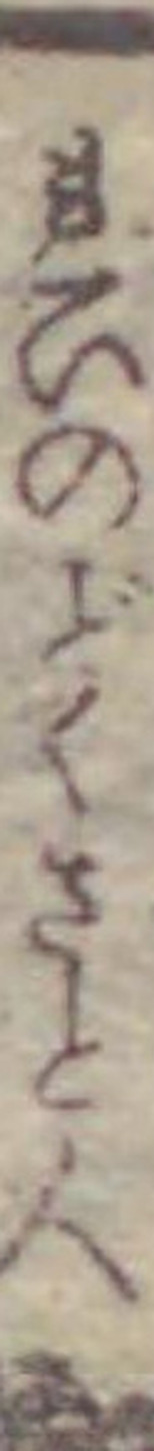れいのごとくさと人
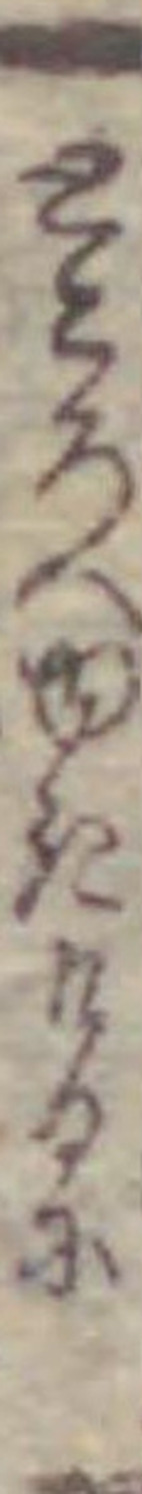ところへゆきけるに
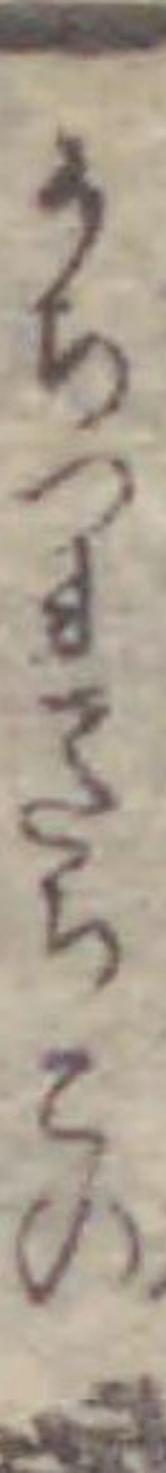うちつれたちこの
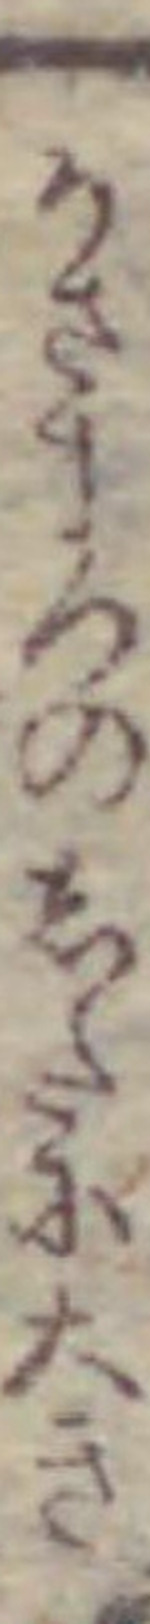かさまつのしたに大き
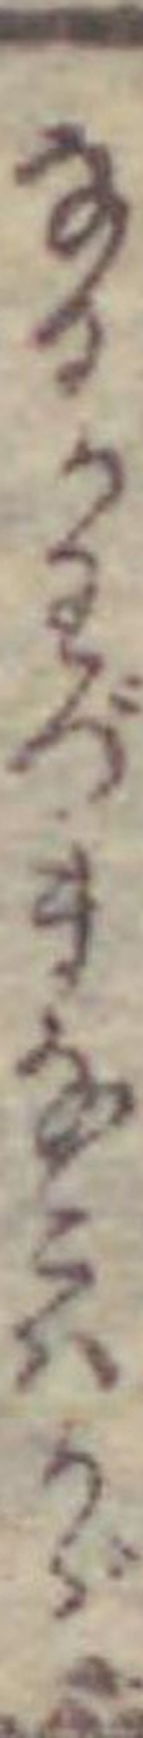なるかわづまなこはかゞ
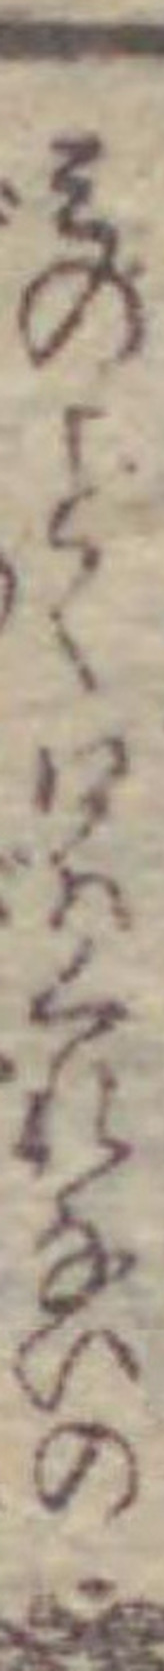みのごとく口はくれないの
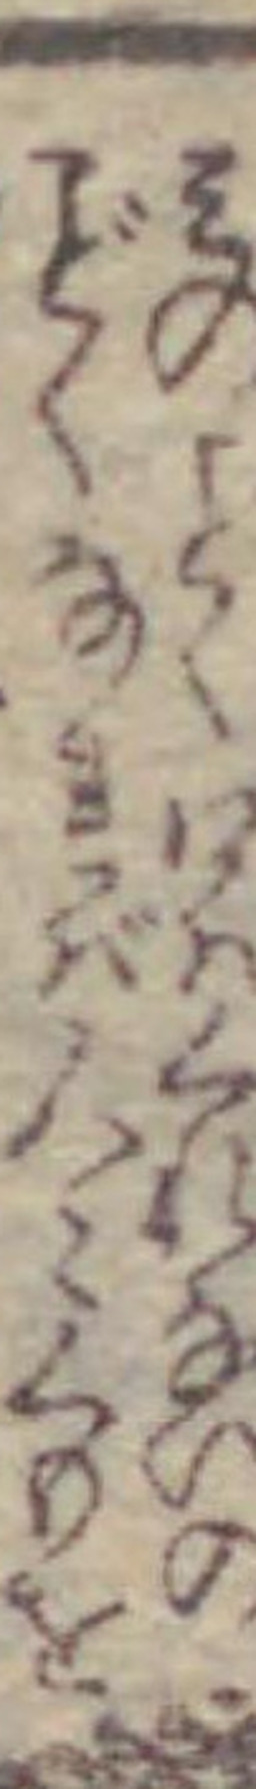ごとくなれば人々くもを
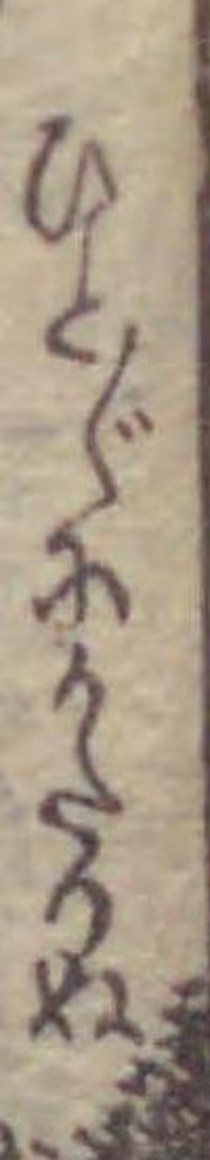ひと〴〵にかたりぬ
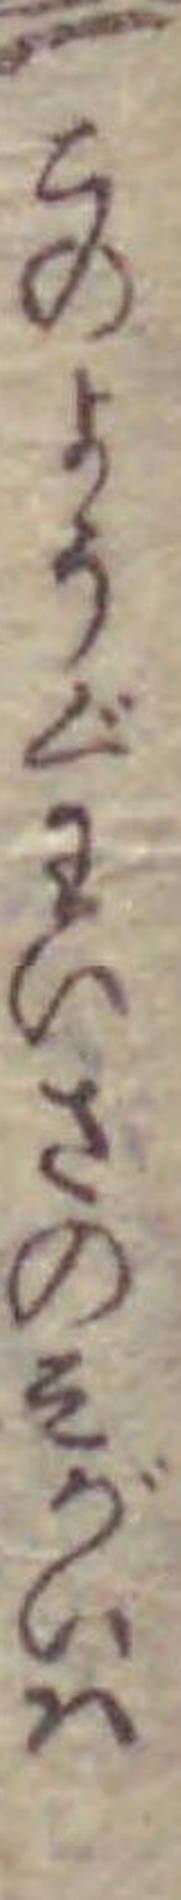このようぐわいさのみがいは
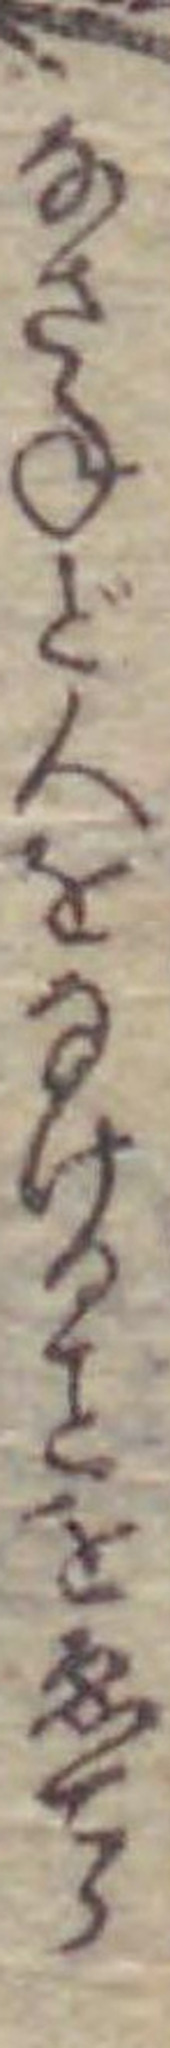なさねど人をなけることをゑてか
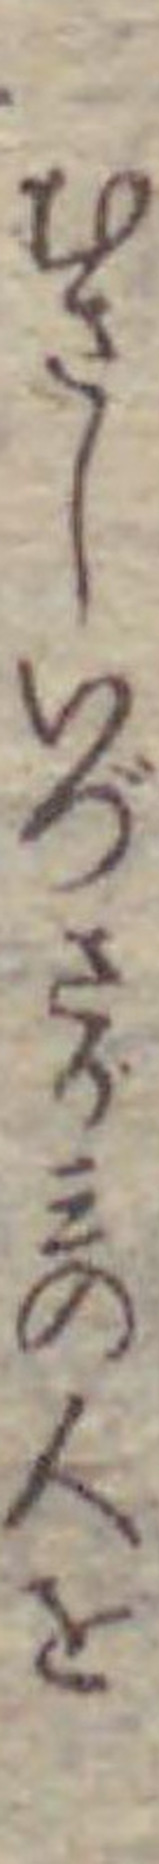むさしいづさがみの人を
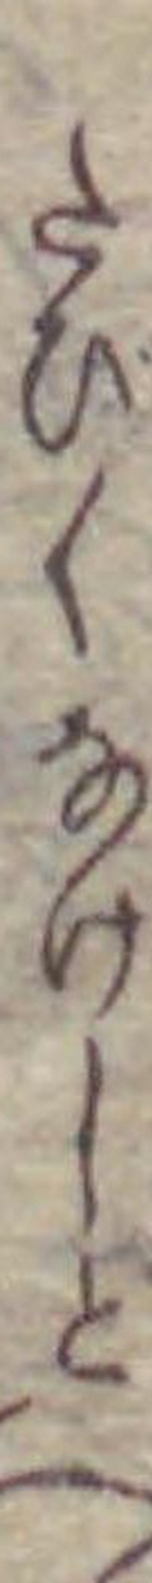たび〳〵なけしと

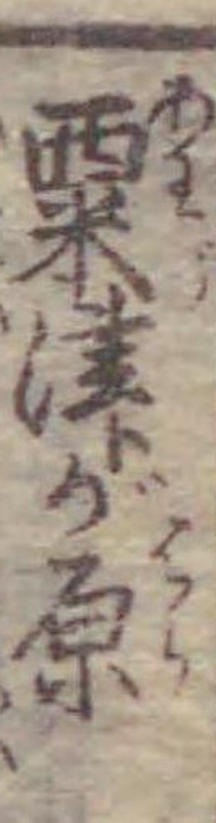粟津が原
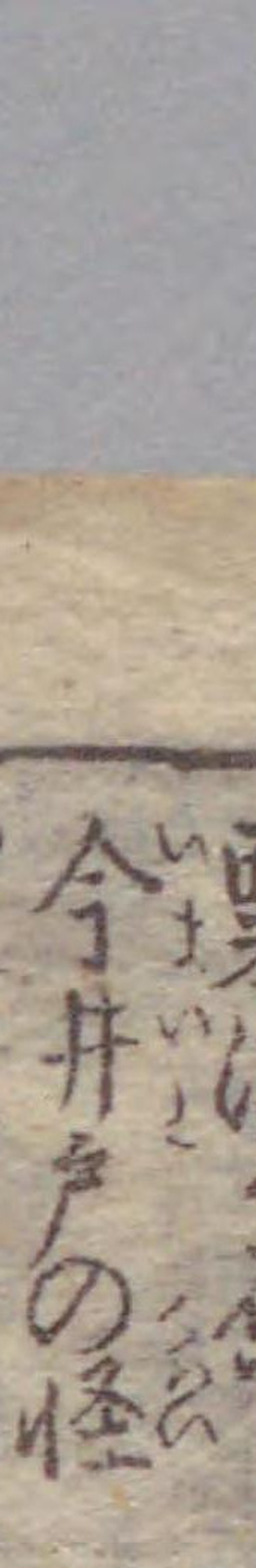今井戸の怪
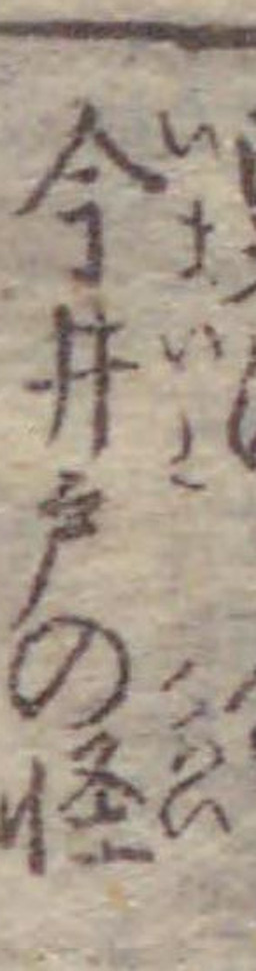今井戸の怪
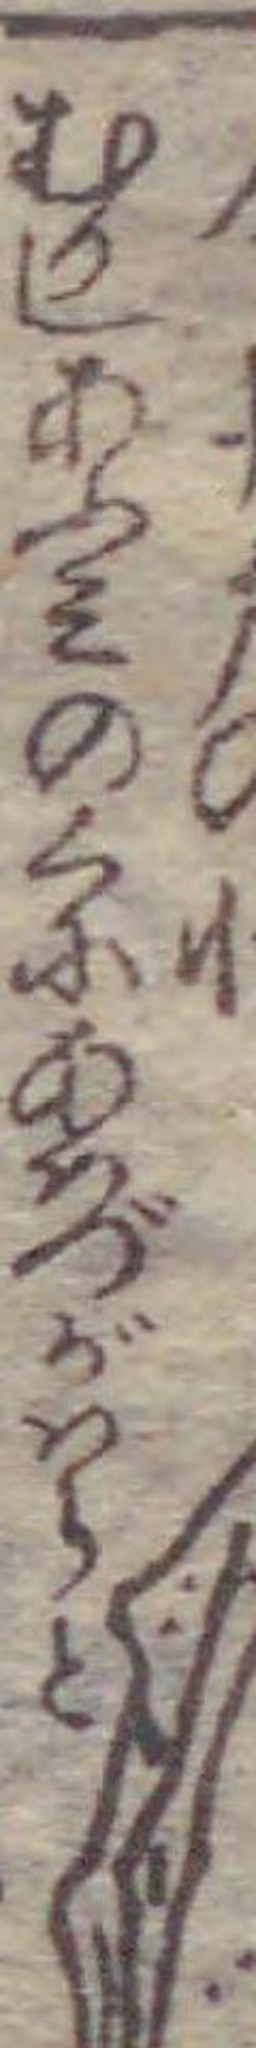むかしあふみのくにあはづがはらと
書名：武家物奇談 : 3巻
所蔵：国立国会図書館 National Diet Library, JAPAN
